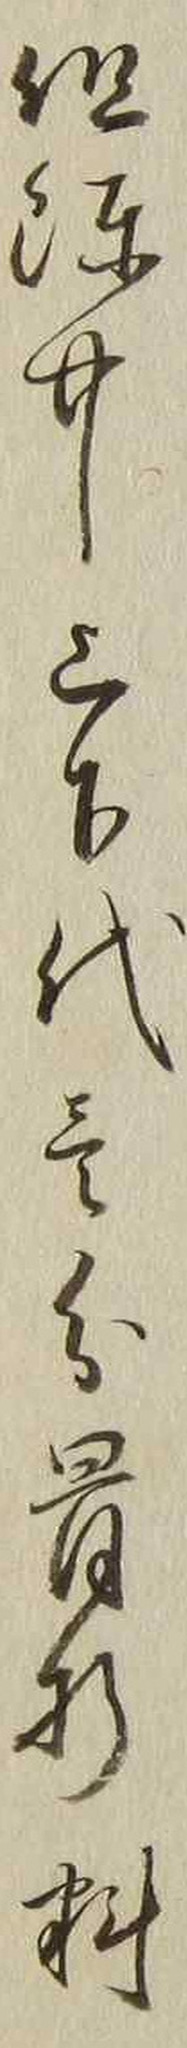但陣中上下代壱分骨折料
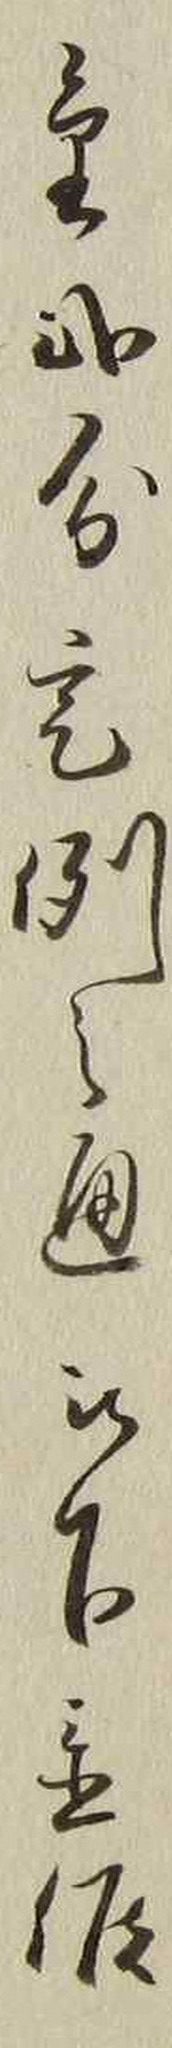金弐分定例之通被下置候

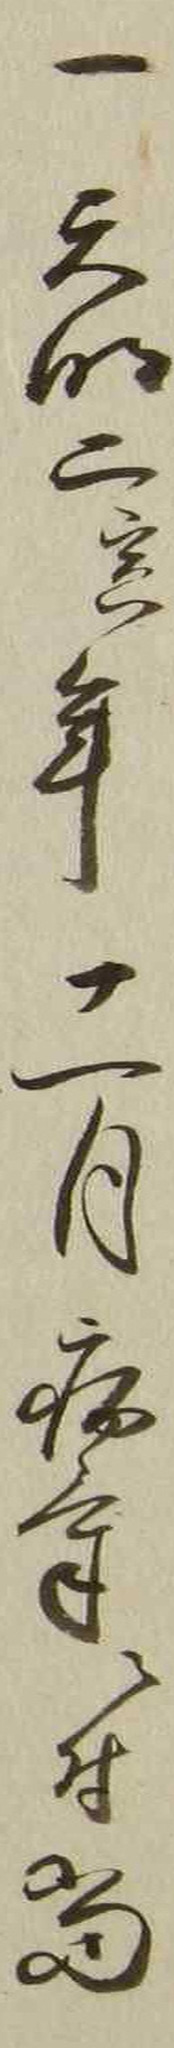一天明二寅年十一月病気ニ付当
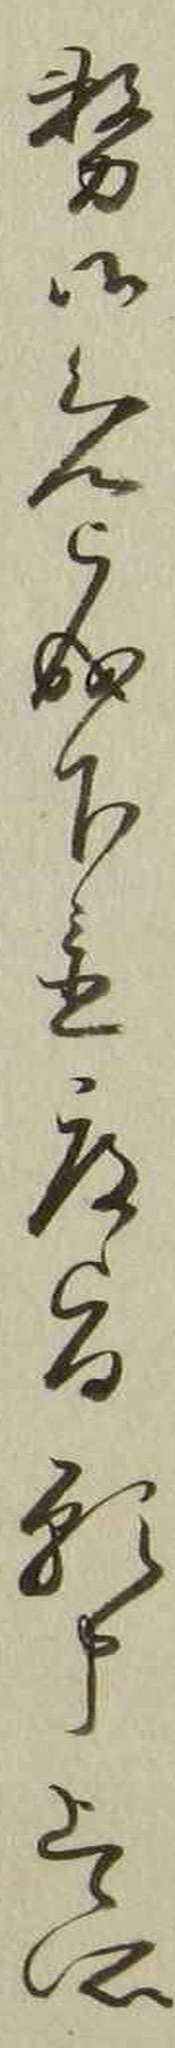務御免被成下置度旨願申上候所
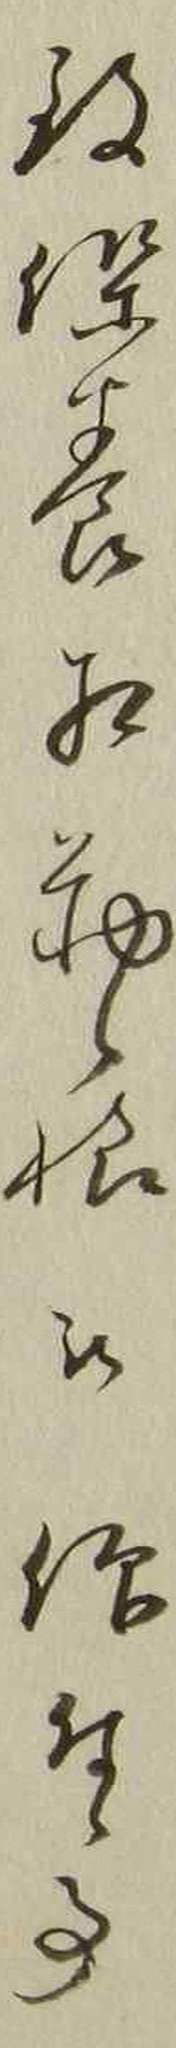致保養相勤候様被仰付候事
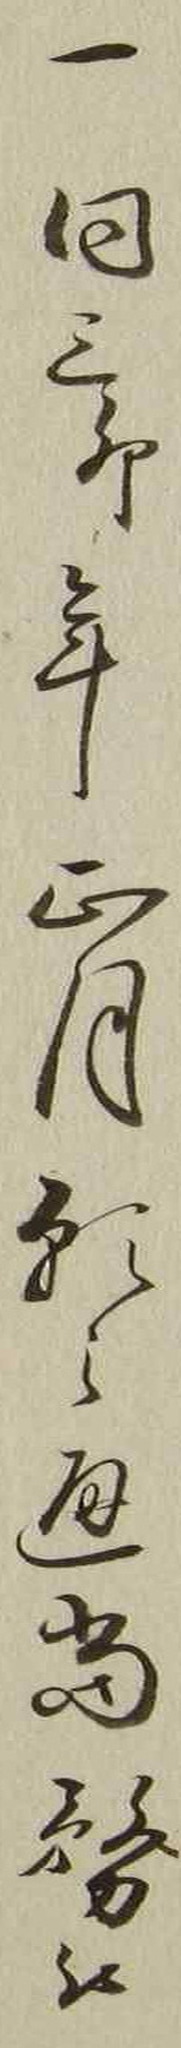一同三卯正月願之通当務被
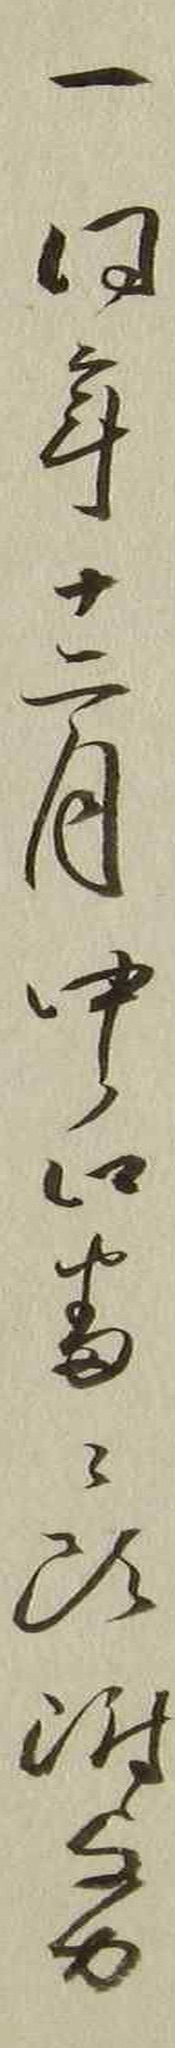一同年十二月中ノ口番ニ頭附与力
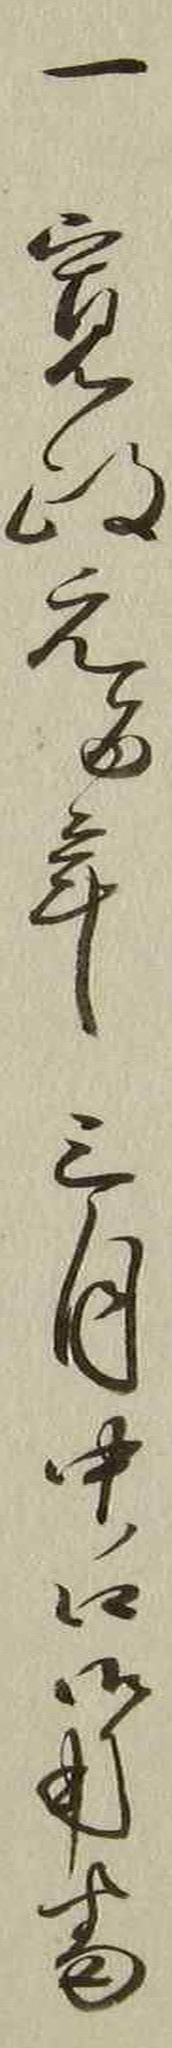一寛政元酉年三月中ノ口御用番
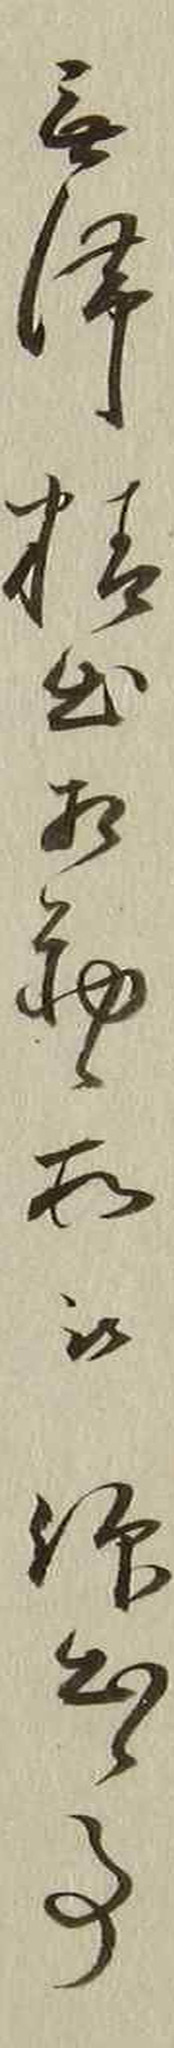無滞精出相勤候段被仰出候事
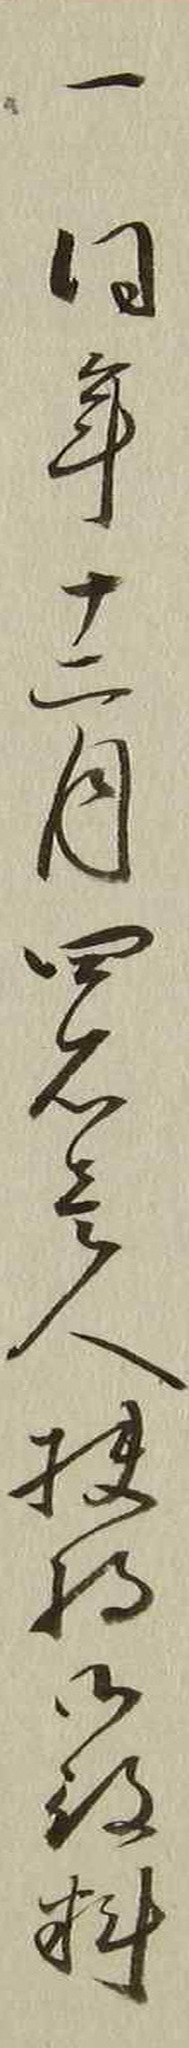一同年十二月四石壱人扶持御役料
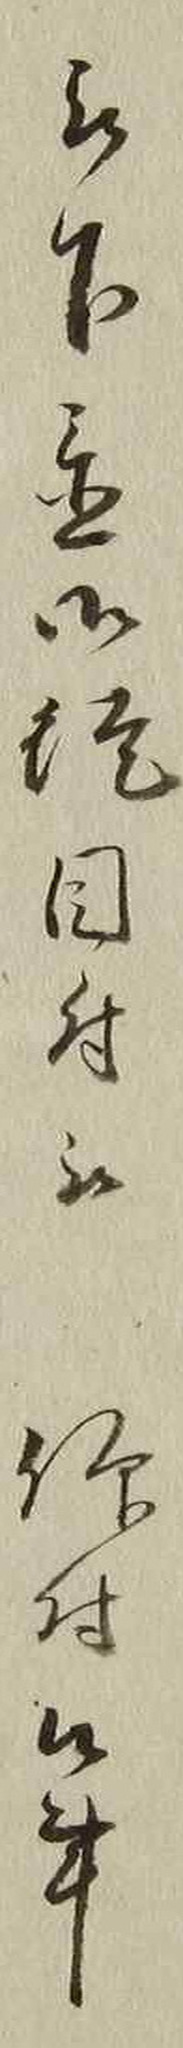被下置御徒目付被仰付候事
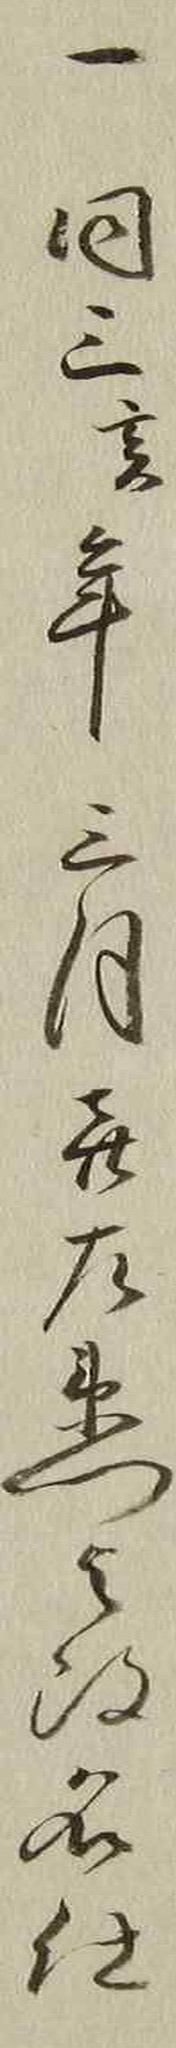一同三亥年三月喜左衛門と改名仕
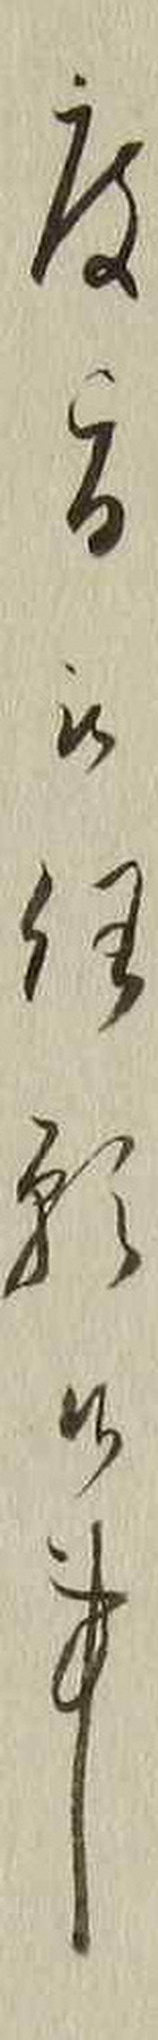度旨被任願候事
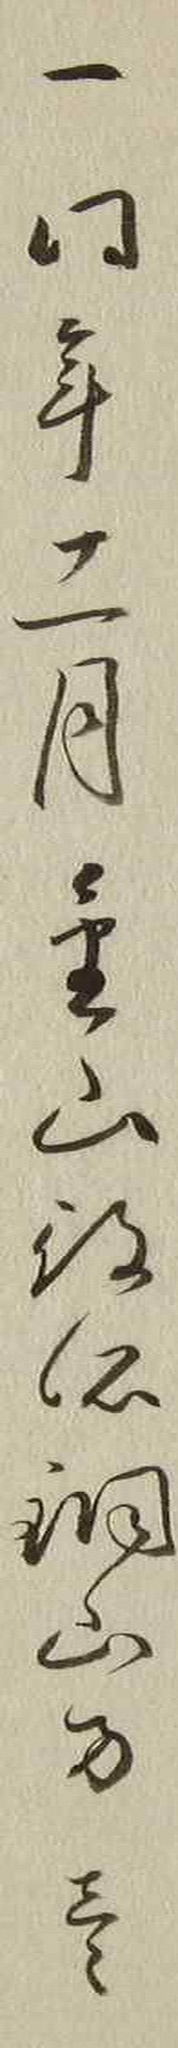一同年十一月金山役所銅山方壱
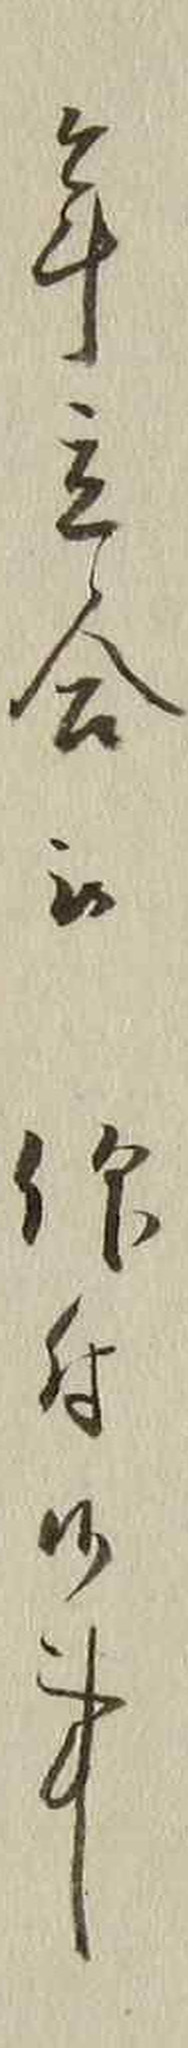年立合被仰付候事
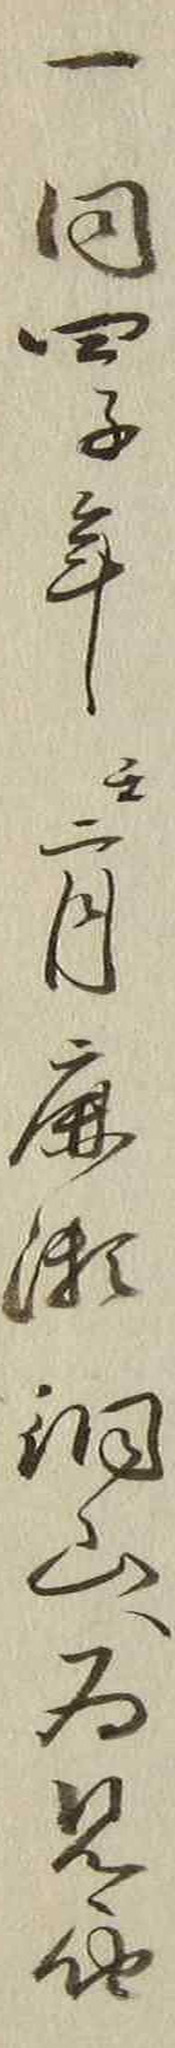一同四子年閏二月鹿瀬銅山へ為見届
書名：諸士系譜　巻之52　に之部3
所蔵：会津若松市立会津図書館
